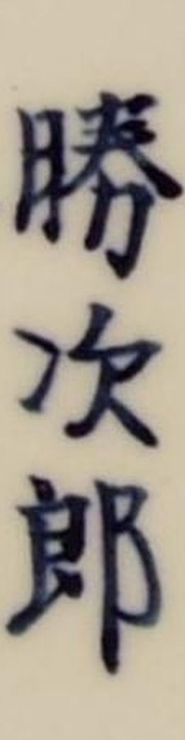勝次郎
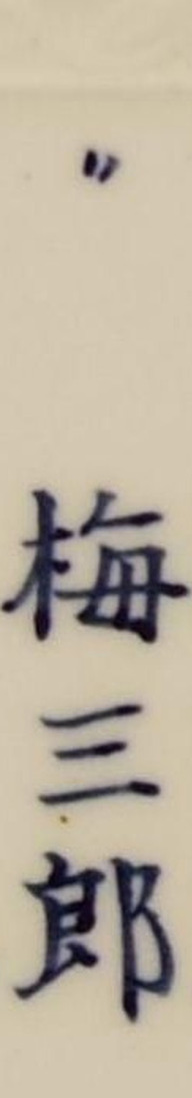梅三郎
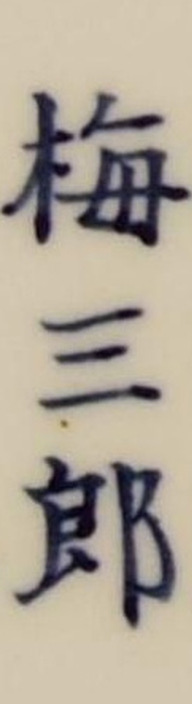梅三郎
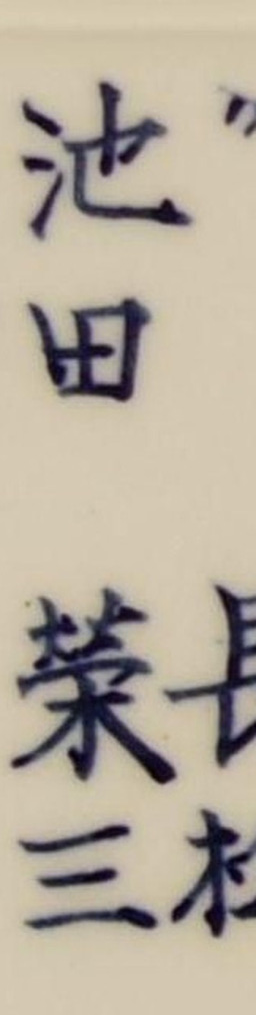池田榮三
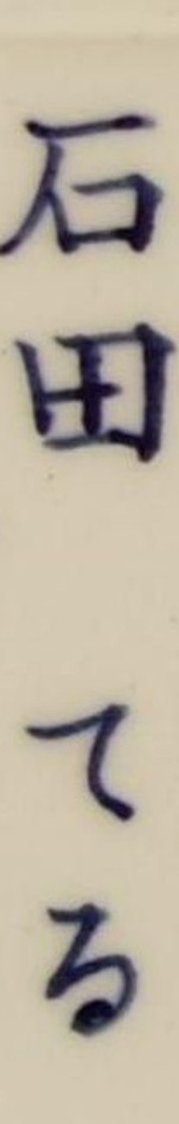石田てる
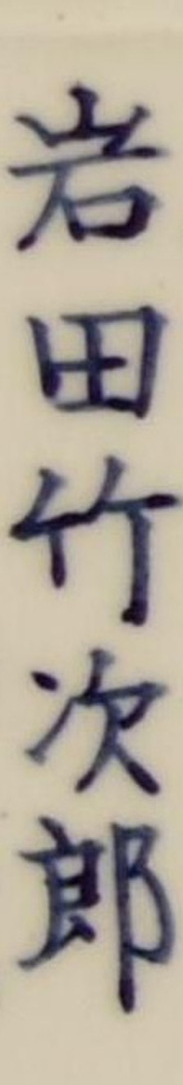岩田竹次郎
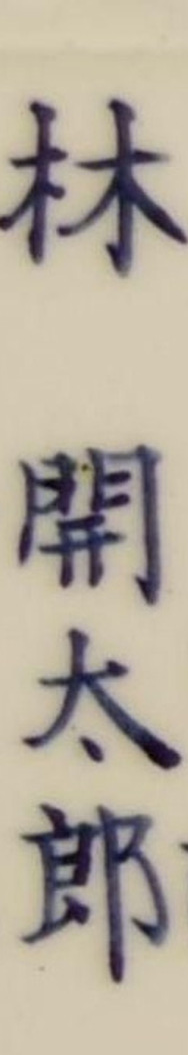林開太郎
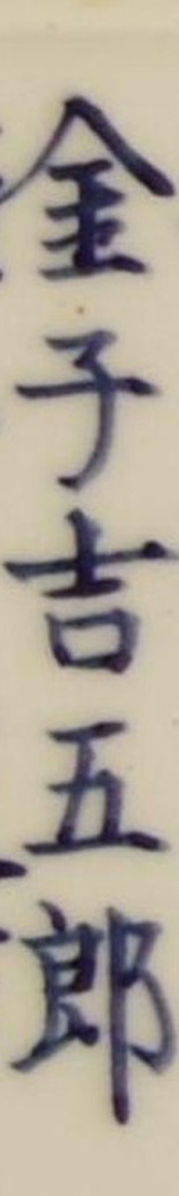金子吉五郎
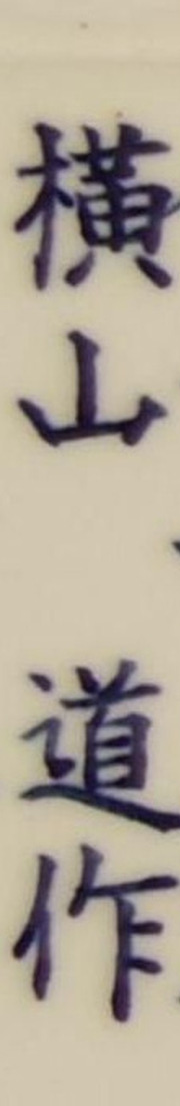横山道作

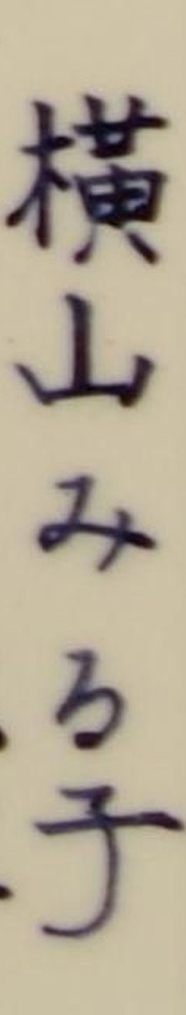横山みる子
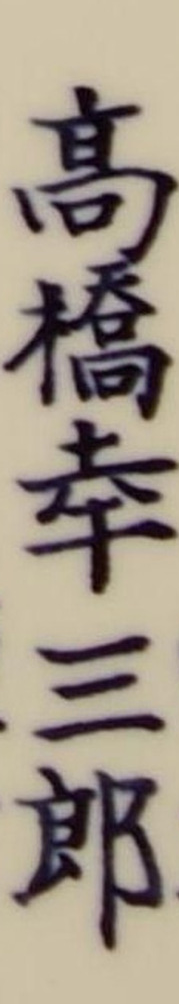高橋幸三郎
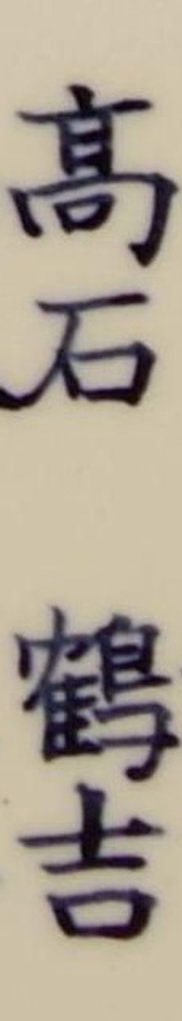高石鶴吉
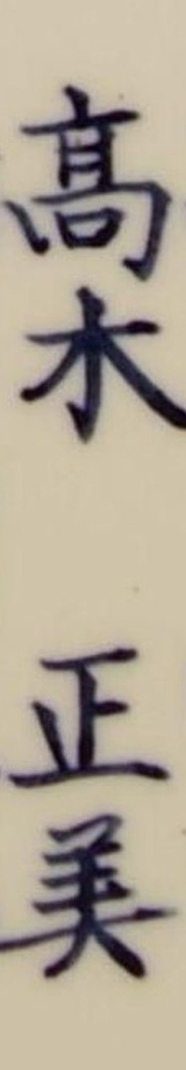高木正美
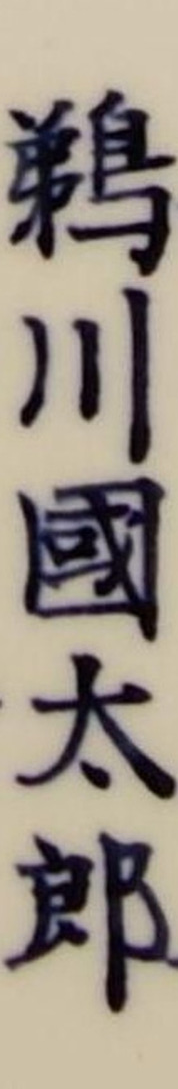鵜川國太郎
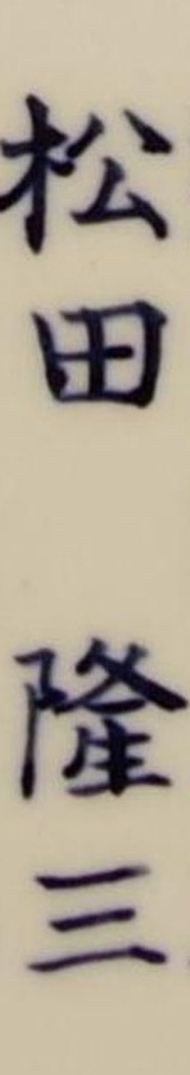松田隆三
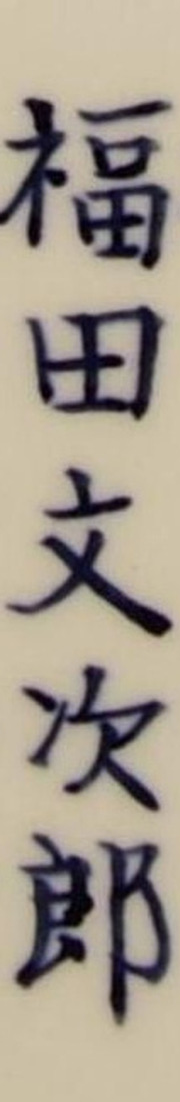福田文次郎
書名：A~D
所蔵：koyasan kongobuji
